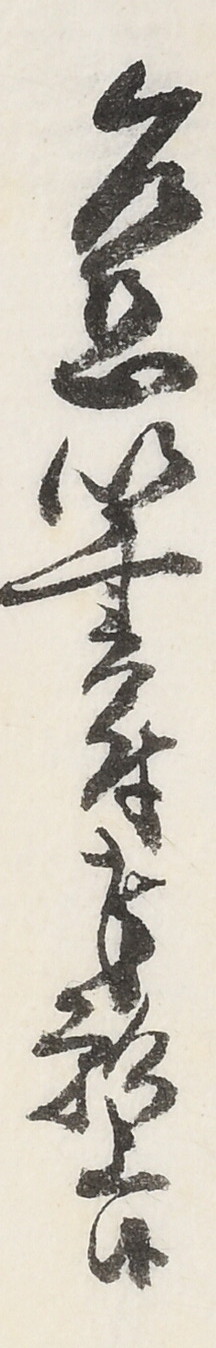乍恐以書付奉願上候
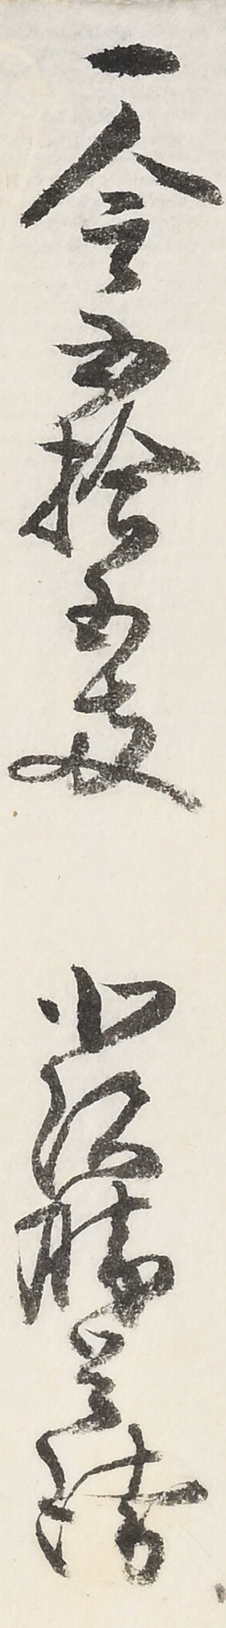一金五拾五両北沢勝兵衛
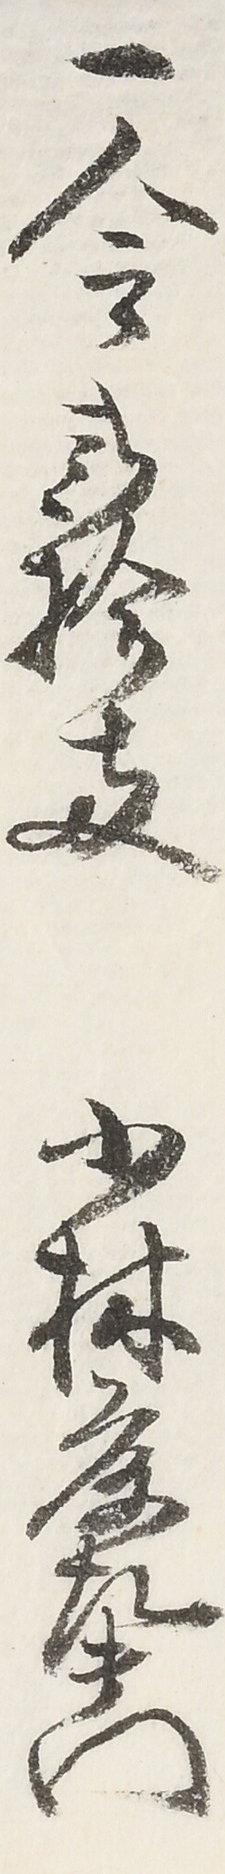一金弐拾両小林藤左衛門
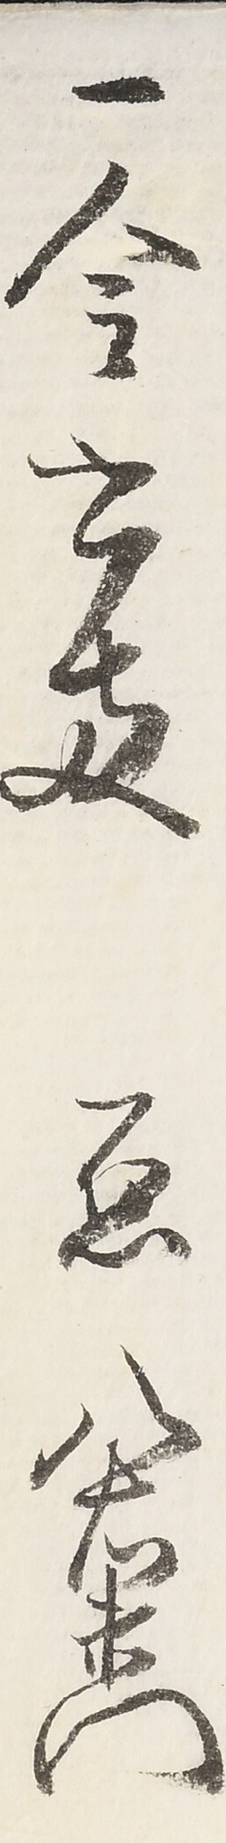一金六両原八右衛門
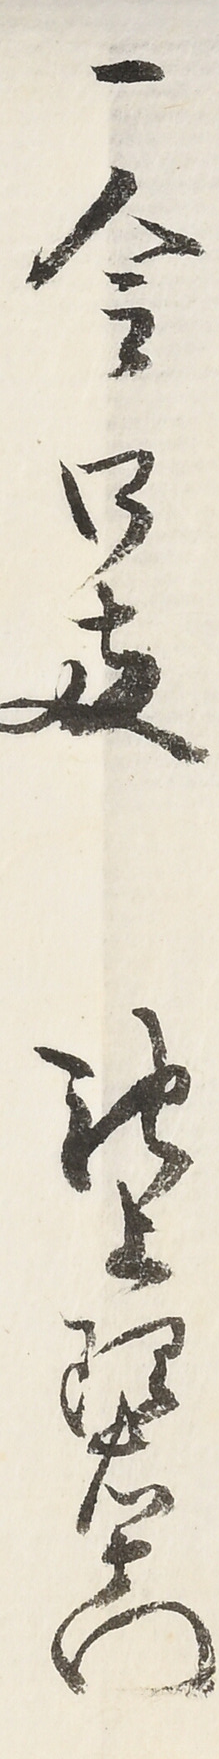一金四両池上理右衛門
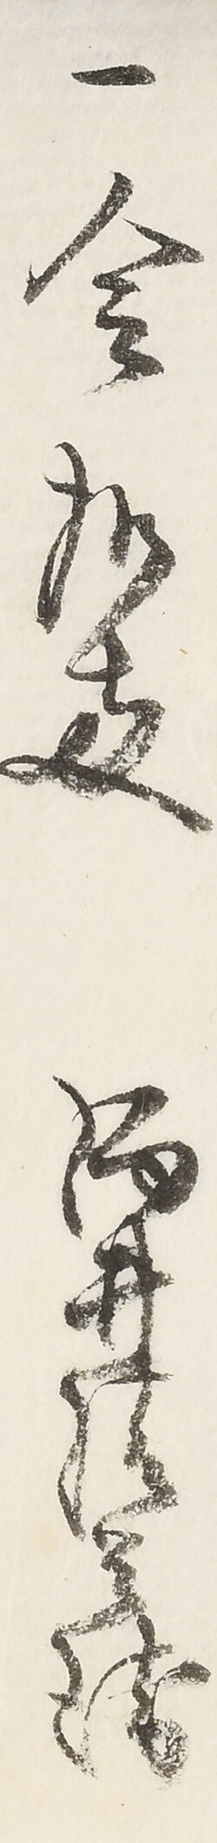一金拾両酒井清兵衛
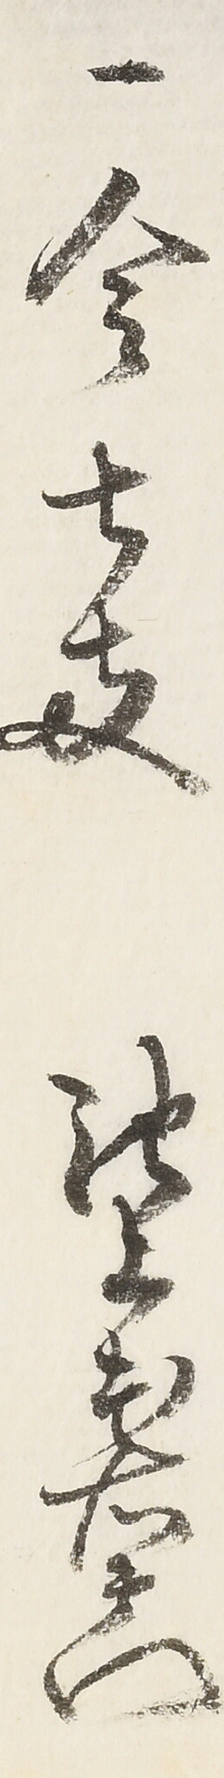一金七両池上本右衛門
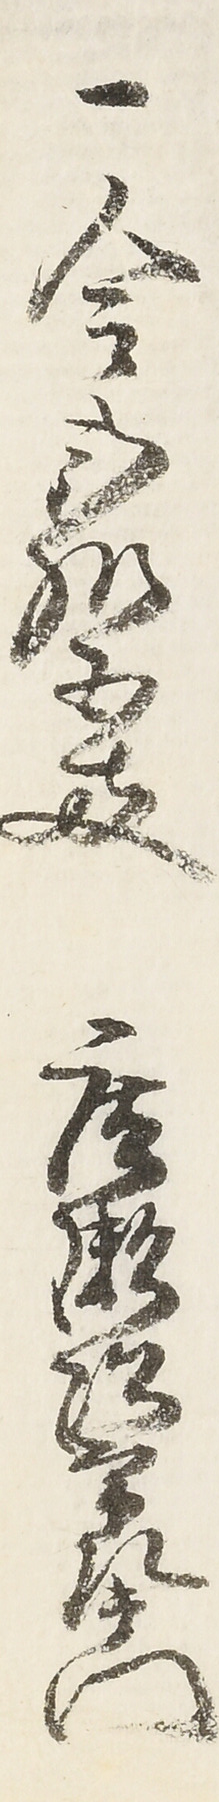一金弐拾五両広瀬次郎左衛門
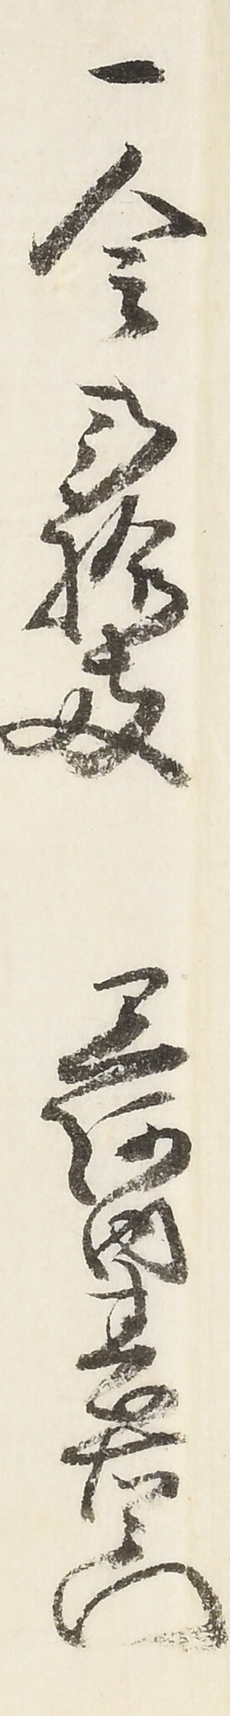一金弐拾両黒河内甚右衛門
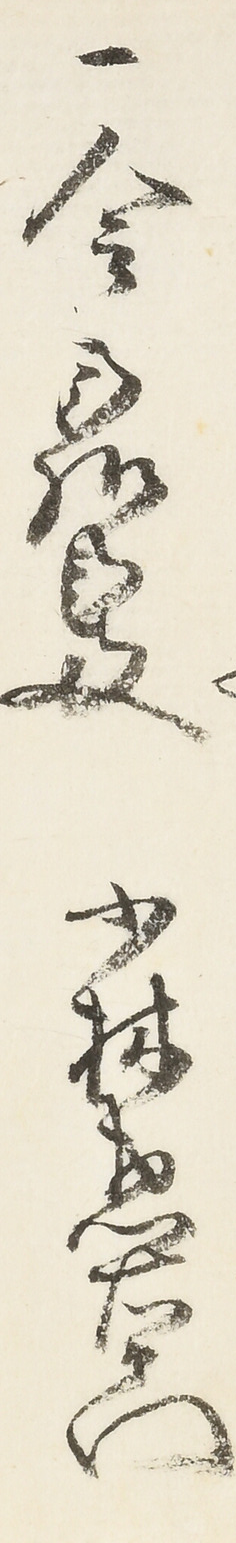一金弐拾弐両小林惣右衛門
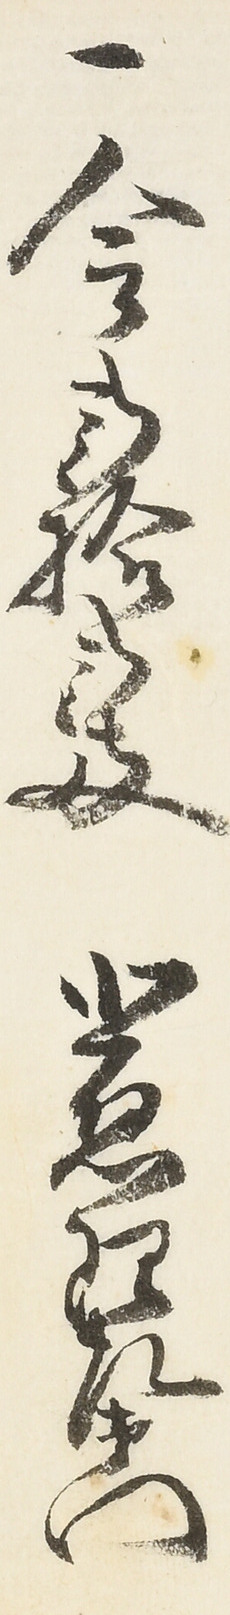一金弐拾弐両北原理左衛門
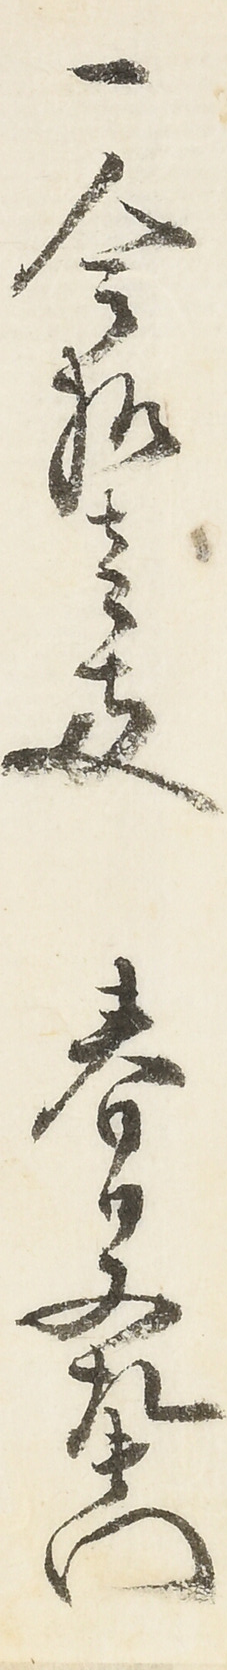一金拾壱両春日又左衛門
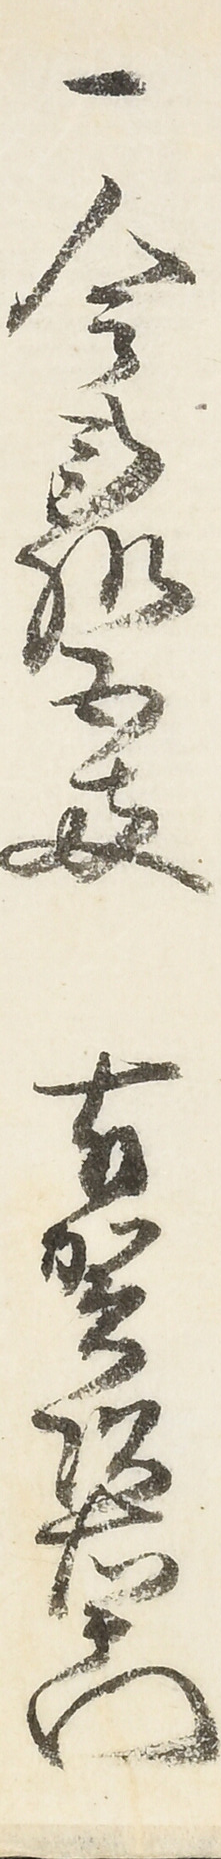一金弐拾五両有賀次右衛門
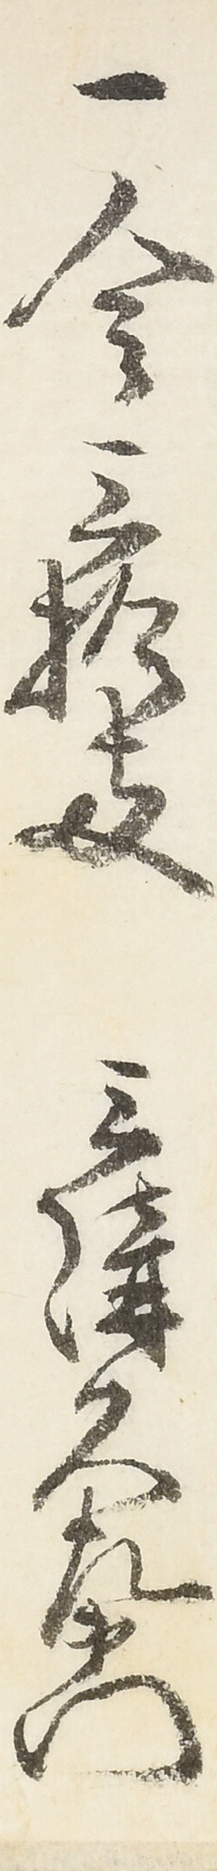一金三拾両三溝久左衛門

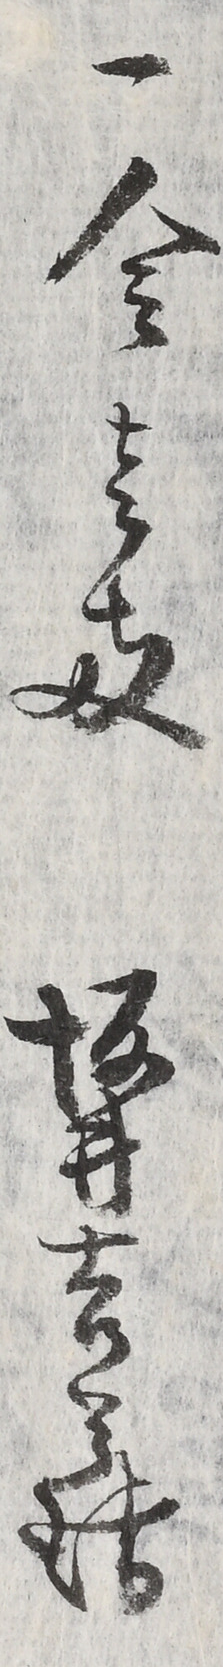一金壱両坂井吉兵衛
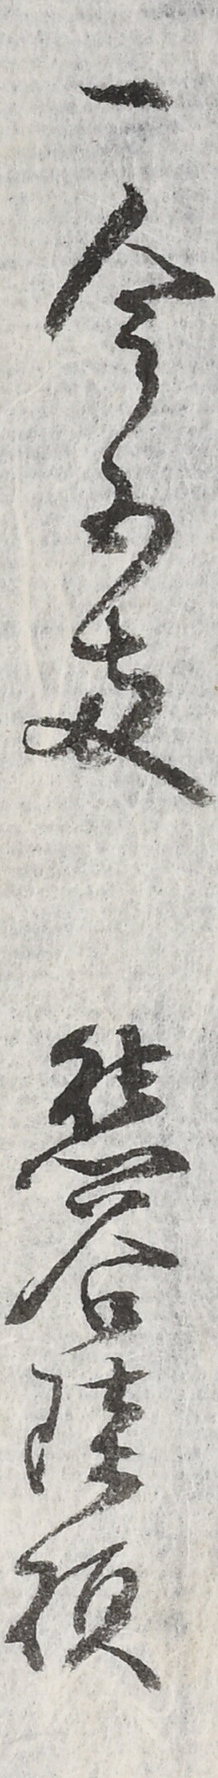一金五両熊谷陸碩
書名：在町帯刀献金割帳
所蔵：伊那市立高遠町図書館・合同会社AMANE
